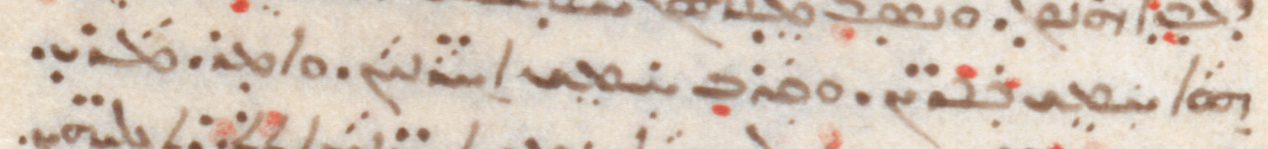ܗܘܐ ܚܡܫ ܟܟܪ̈ܝܢ. ܘܩܪܒ ܚܡܫ ܐܚܪ̈ܢܝܢ. ܘܐܡ̣ܪ. ܡܪܝ܆
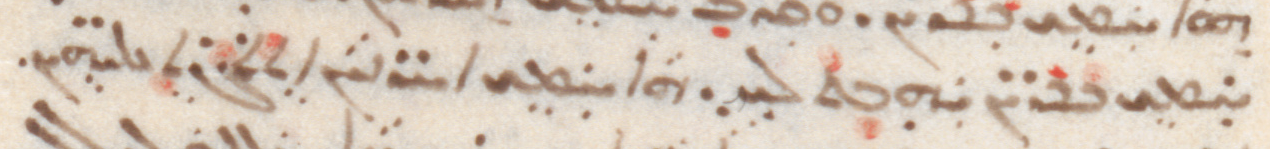ܚܡܫ ܟܟܪ̈ܝܢ ܝܗܒܬ ܠܝ܆ ܗܐ ܚܡܫ ܐܚܪ̈ܢܝܢ ܐܬܬܓܪܬ ܥܠܝܗ̈ܝܢ.
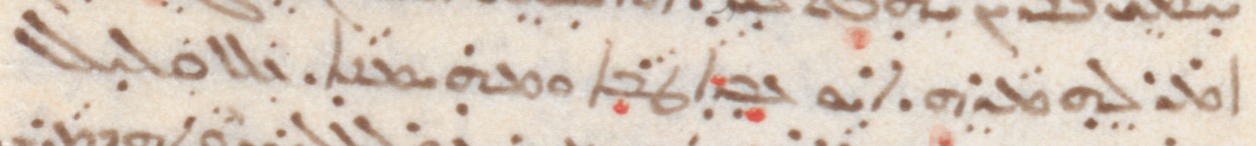ܐܡ̇ܪ ܠܗ ܡܪܗ. ܐܝܘ ܥܒܕܐ ܛܒܐ ܘܡܗܝܡܢܐ. ܥܠ ܩܠܝܠ
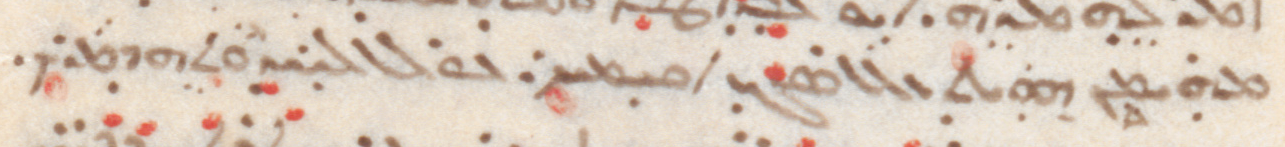ܡܗܝܡܢ ܗܘܝܬ ܥܠ ܣܓܝ ܐܩܝܡܟ: ܥܘܠ ܠܚܕܘܬܗ ܕܡܪܟ
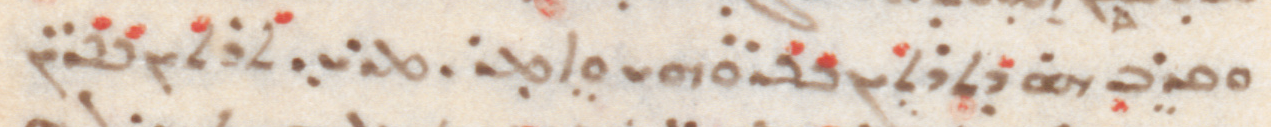ܘܩܪܒ ܗ̇ܘ ܕܬܪܬܝܢ ܟܟܪ̈ܘܗܝ ܘܐܡ̣ܪ. ܡܪܝ܆ ܬܪܬܝܢ ܟܟܪ̈ܝܢ
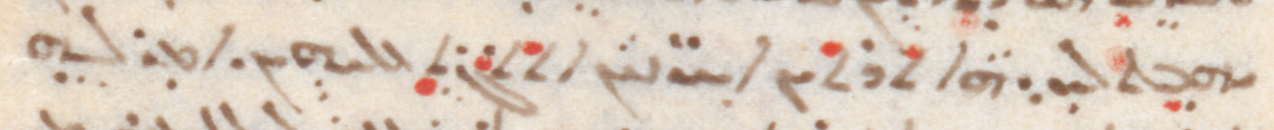ܝܗܒܬ ܠܝ܆ ܗܐ ܬܪܬܝܢ ܐܚܪ̈ܢܝܢ ܐܬܬܓܪܬ ܥܠܝܗܝܢ. ܐܡܼܪ ܠܗ
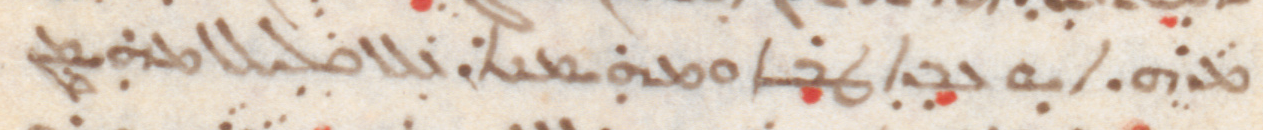ܡܪܗ. ܐܝܘ ܥܒܕܐ ܛܒܐ ܘܡܗ̇ܝܡܢܐ: ܥܠ ܩܠܝܠ ܡܗܝܡܢ
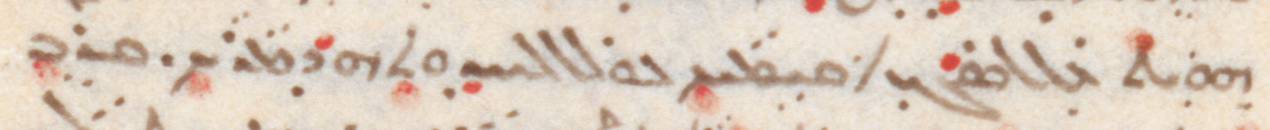ܗܘܝܬ ܟܠ ܣܓܝ ܐܩܝܡܟ ܥܘܠ ܠܚܕܘܬܗ ܕܡܪܟ. ܩܪܒ
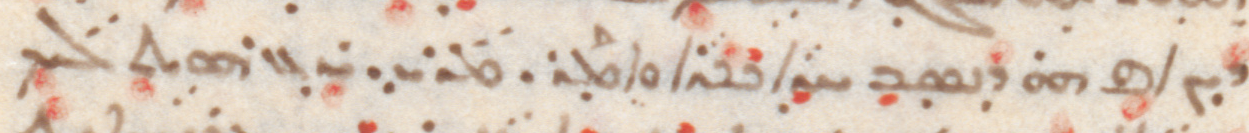ܕܝܢ ܐܦ ܗ̇ܘ ܕܢܣ̣ܒ ܚܕܐ ܟܟܪܐ ܘܐܡ̣ܪ܆ ܡܪܝ ܝ̇ܕܥ ܗܘܝܬ ܠܟ
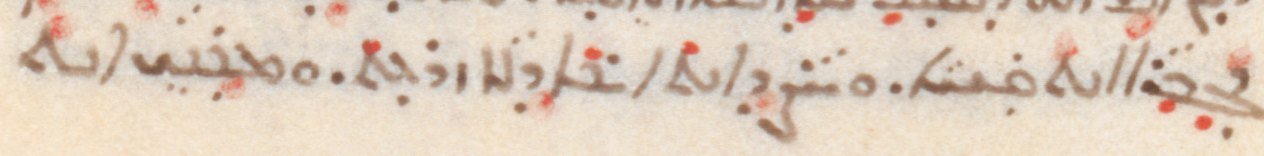ܕܓܒܪܐ ܐܢܬ ܩܫܝܐ. ܘܚ̇ܨܕ ܐܢܬ ܐܝܟܐ ܕܠܐ ܙܪܥ̣ܬ. ܘܡܟܢܫ ܐܢܬ
